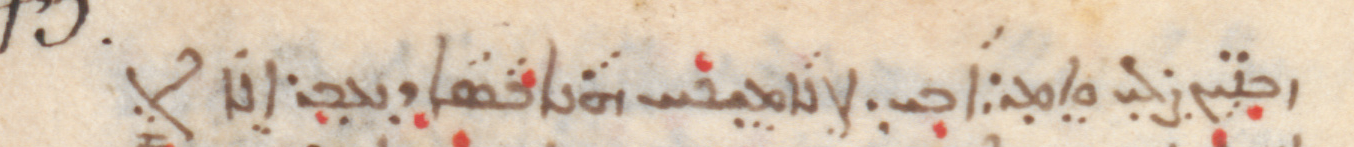ܙܒܢ̈ܝܢ ܨܠܝ ܘܐܡ̣ܪ ܐܒܝ܆ ܐܢ ܠܐ ܡܫܟܚ ܗܢܐ ܟܣܐ ܕܢܥܒܪ ܐܠܐ ܐܢ
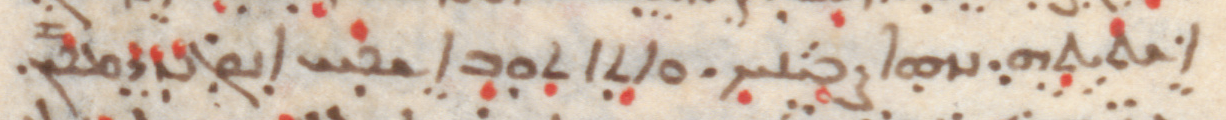ܐܫܬܝܬܗ܆ ܢܗܘܐ ܨܒܝܢܟ. ܘܐܬ̣ܐ ܬܘܒ ܐܫܟܚ ܐܢܘܢ ܟܕ ܕܡܟܝܢ.
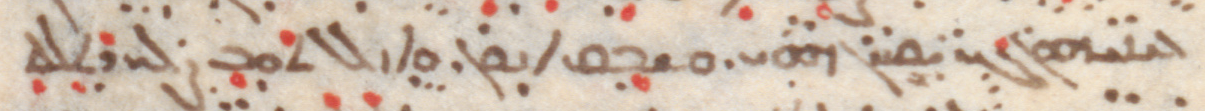ܥܝܢ̈ܝܗܘܢ ܓܝܪ ܝܩܝܪܢ ܗܘܝ. ܘܫܒ̣ܩ ܐܢܘܢ. ܘܐܙܠ ܬܘܒ ܨܠܝ ܕܬܠܬ
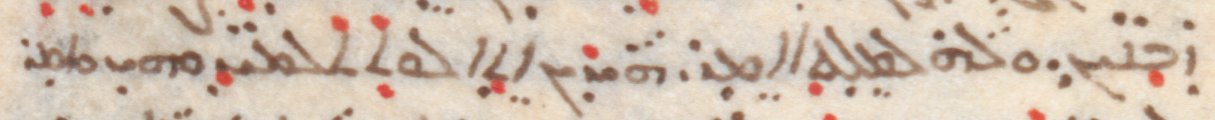ܙܒܢ̈ܝܢ܆ ܘܠܗ̇ ܠܡܠܬܐ ܐܡ̣ܪ. ܗܝܕܝܢ ܐܬܐ ܠܘܬ ܬܠܡܝ̈ܕܘܗܝ ܘܐܡ̣ܪ
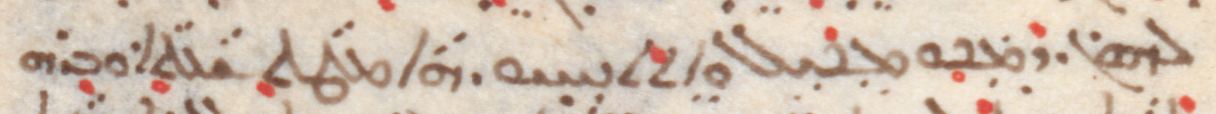ܠܗܘܢ. ܕܡܟܘ ܡܟܝܠ ܘܐܬܬܢܝܚܘ. ܗܐ ܡܛܬ ܫܥܬܐ ܘܒܪܗ
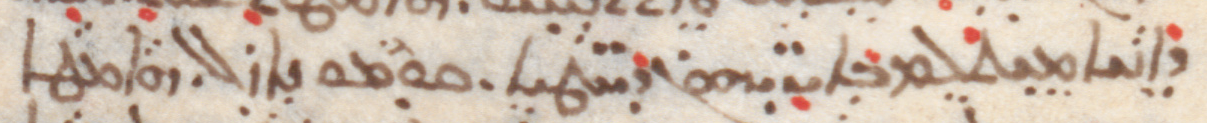ܕܐܢܫܐ ܡܫܬܠܡ ܒܐܝܕܝ̈ܗܘܢ ܕܚ̈ܛܝܐ. ܩܘܡܘ ܢܐܙܠ. ܗܐ ܡܛܐ
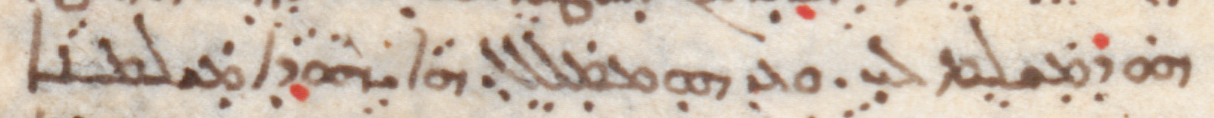ܗܘ ܕܡܫܠܡ ܠܝ. ܘܥܕ ܗܘ ܡܡܠܠ܆ ܗܐ ܝܗܘܕܐ ܡܫܠܡܢܐ
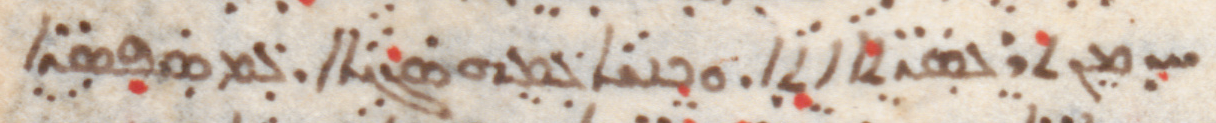ܚܕ ܡܢ ܬܪܥܣܪ̈ܬܐ ܐܬܐ. ܘܟܢܫܐ ܥܡܗ ܣܓܝܐܐ. ܥܡ ܣܦܣܪ̈ܐ
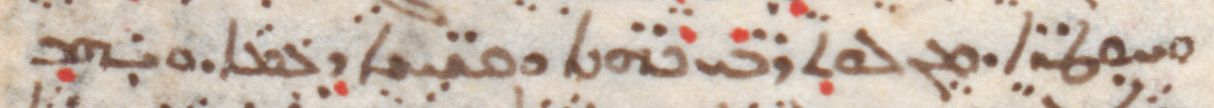ܘܚܘܛܪ̈ܐ. ܡܢ ܠܘܬ ܪ̈ܒܝ ܟܗܢܐ ܕܩܫ̈ܝܫܐ ܕܥܡܐ. ܘܝܗܒ
